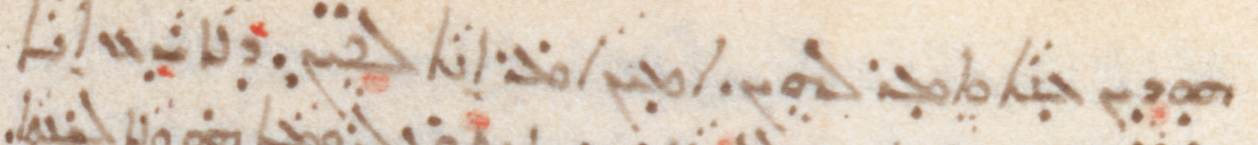ܗܘ̣ ܕܝܢ ܥܢ̣ܐ ܘܐܡ̣ܪ ܠܗܝܢ. ܐܡܝܢ ܐܡ̇ܪ ܐܢܐ ܠܟܝ̈ܢ܆ ܕܠܐ ܝ̇ܕܥ ܐܢܐ
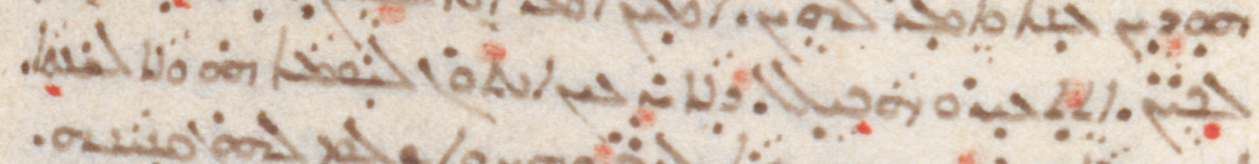ܠܟܝ̈ܢ. ܐܬܬܥܝܪܘ ܗܟܝܠ. ܕܠܐ ܝ̇ܕܥܝܢ ܐܢܬܘܢ ܠܝܘܡܐ ܗ̇ܘ ܘܠܐ ܠܫܥܬܐ.
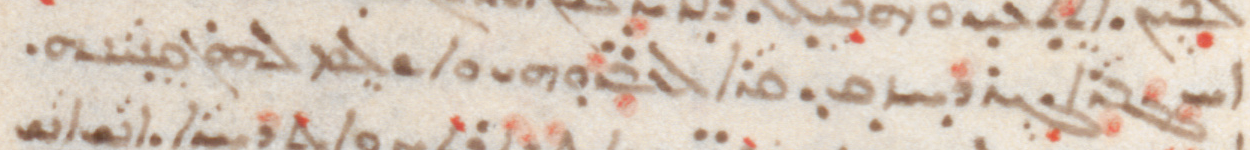ܐܝܟ ܓܒܪܐܓܝܪ ܕܚܙܩ܆ ܩܪܐ ܠܥܒ̈ܕܘܗܝ ܘܐܫܠܡ ܠܗܘܢ ܩܢܝܢܗ.
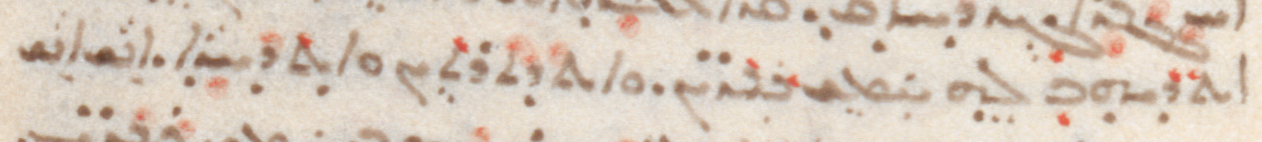ܐܝܬ ܕܝܗ̣ܒ ܠܗ ܚܡܫ ܟܟܪ̈ܝܢ. ܘܐܝܬ ܕܬܪܬܝܢ ܘܐܝܬ ܕܚܕܐ. ܐܢܫ ܐܢܫ
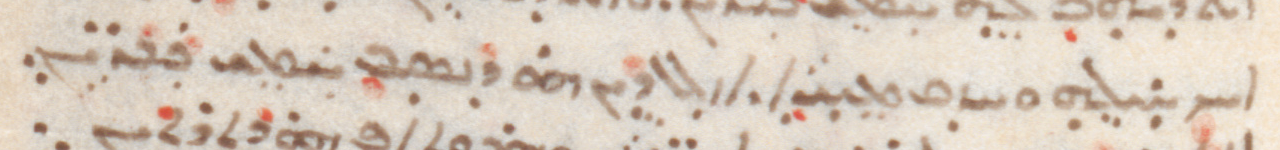ܐܝܟ ܚܝܠܗ ܘܚܙ̣ܩ ܡܚܕܐ. ܐܙ̣ܠ ܕܝܢ ܗ̇ܘ ܕܢܣ̣ܒ ܚܡܫ ܟܟܪ̈ܝܢ:
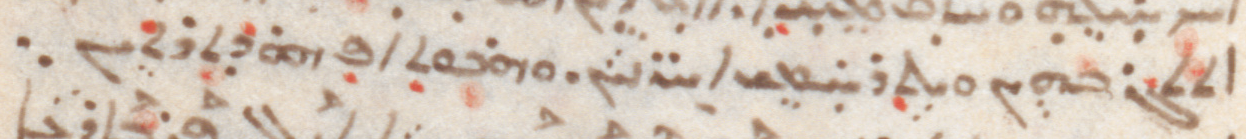ܐܬܬܓܪ ܒܗܝܢ ܘܝܬܪܚܡܫ ܐܚܪ̈ܢܝܢ. ܘܗܟܘܬ ܐܦ ܗ̇ܘ ܕܬܪܬܝܢ܆
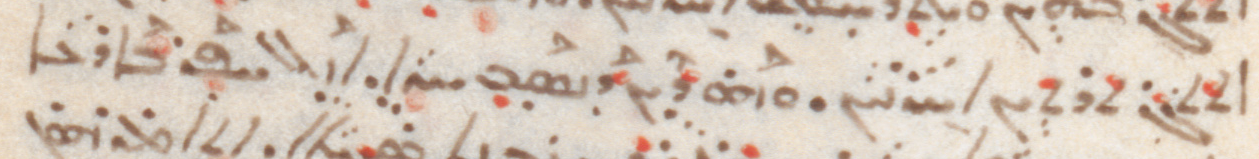ܐܬܬܓܪ ܬܪܬܝܢ ܐܚܪ̈ܢܝܢ. ܘܗ̇ܘ ܕܝܢ ܕܢܣ̣ܒ ܚܕܐ. ܐܙ̣ܠ ܚܦܪ ܒܐܪܥܐ
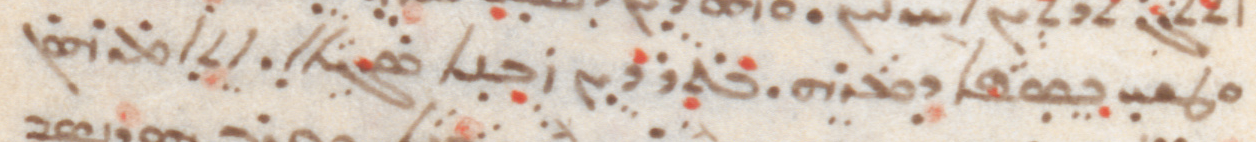ܘܛܫܝ ܟܣܦܐ ܕܡܪܗ. ܒܬܪ ܕܝܢ ܙܒܢܐ ܣܓܝܐܐ. ܐܬ̣ܐ ܡܪܗܘܢ
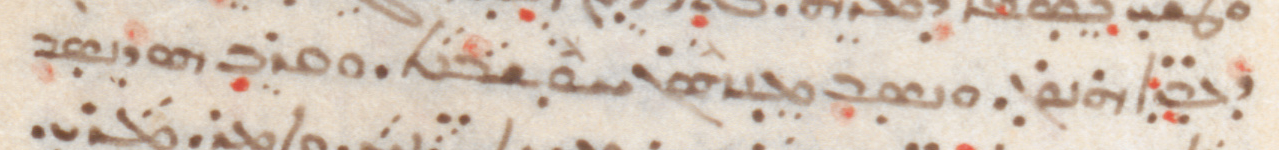ܕܥܒ̈ܕܐ ܗܢܘܢ܆ ܘܢܣ̣ܒ ܡܢܗܘܢ ܚܘܫܒܢܐ. ܘܩܪܒ ܗܘ ܕܢܣ̣ܒ
